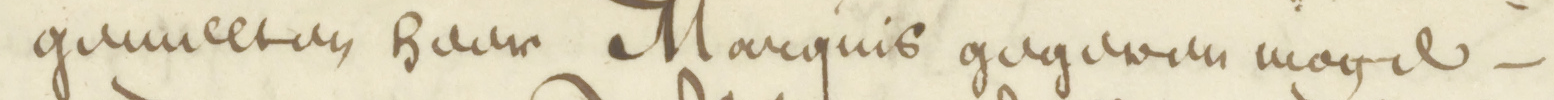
gemelten heer Marquis gegeven moge —
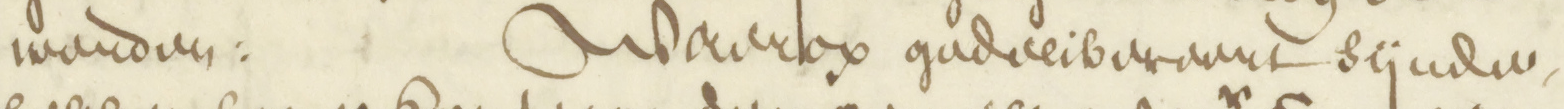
werden: Waerop gedelibereert sijnde,
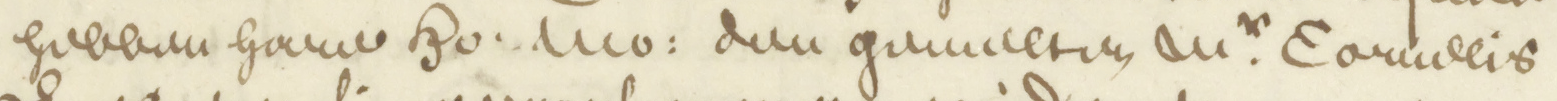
hebben hare Ho:Mo: den gemelten mr. Cornelis —
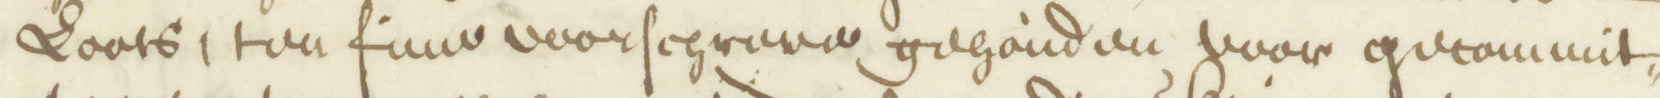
Loots, ten fine voorschreve gehouden voor gecommit„
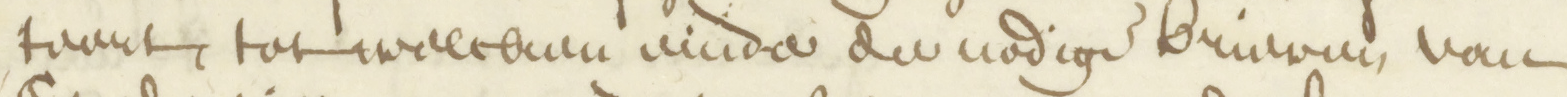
„teert, tot welcken einde de nodige brieven van
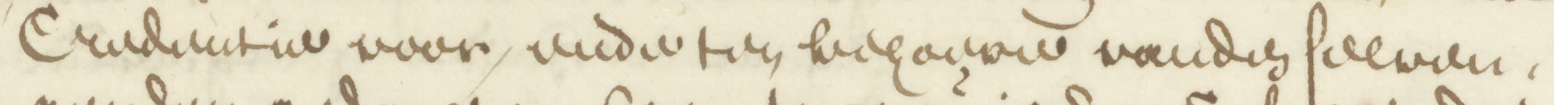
Credentie voor, ende ten behoeve vanden selven,
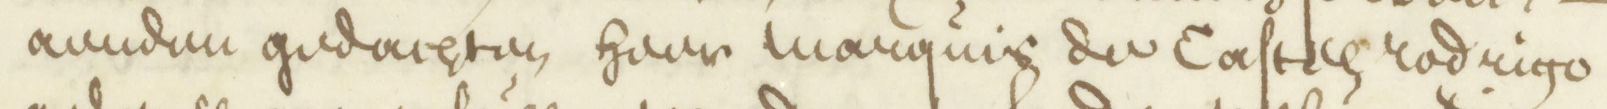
aenden gedachten heer Marquis de Castel rodrigo
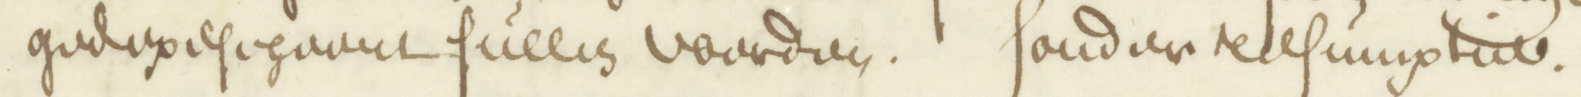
gedepescheert sullen werden. sonder resumptie.
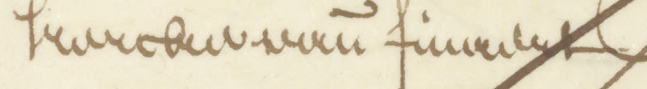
kercke van finaert
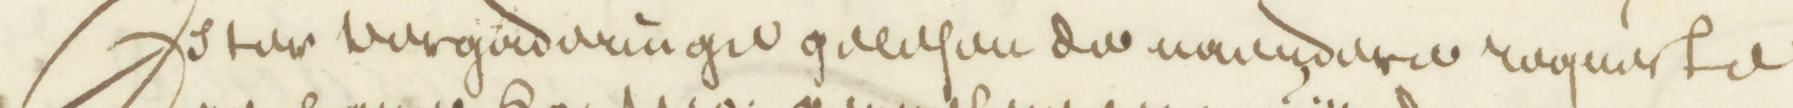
Is ter vergaderinge gelesen de naerdere requeste
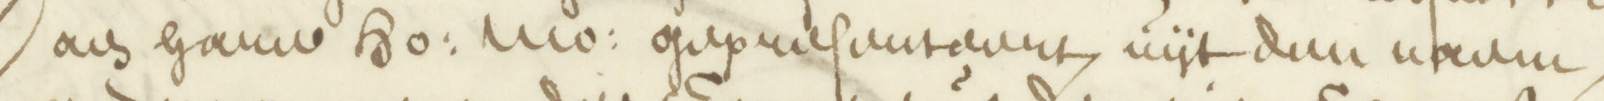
aen hare Ho:Mo: gepresenteert, uijt den naem,
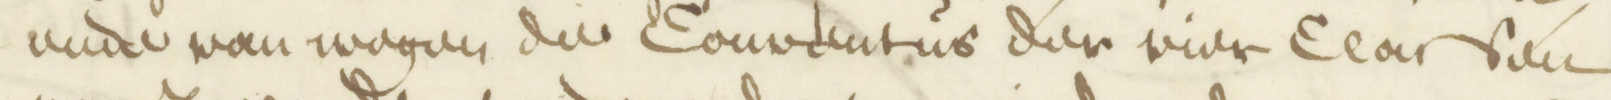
ende van wegen de Conventus der vier Classen
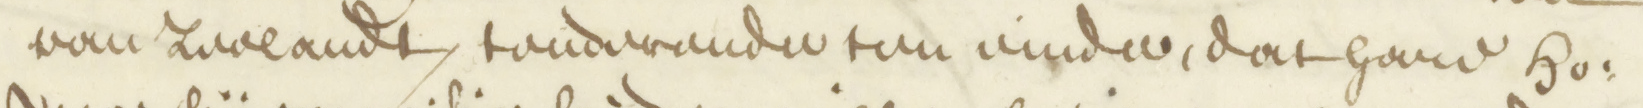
van Zeelandt, tenderende ten einde, dat hare Ho:
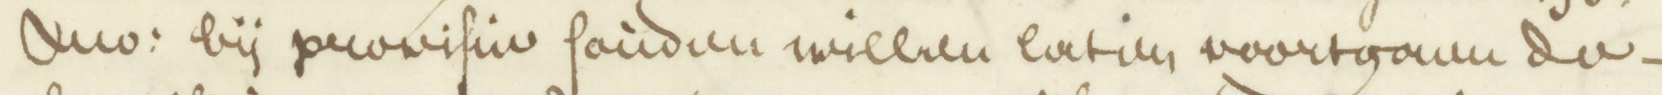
Mo: bij provisie souden willen laten voortgaen de
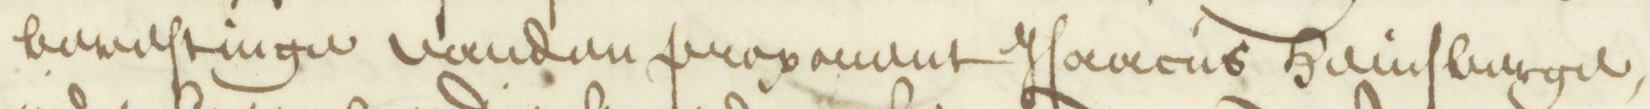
bevestinge vanden proponent Isaacus Heinsberge,
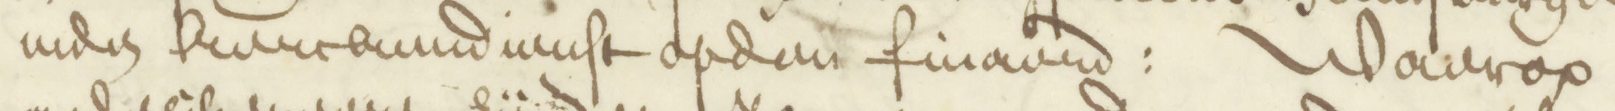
inden kerckendienst opden finaerd: Waerop
